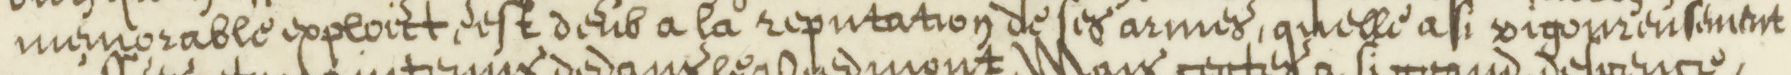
memorable exploict, est deub a la reputation de ses armes, quelle a si vigoureusement
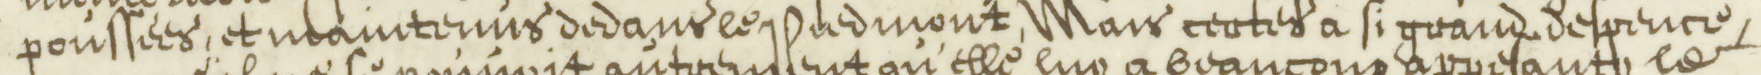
poussees, et maintenus dedans le Piedmont, Mais certes a si grand despence,
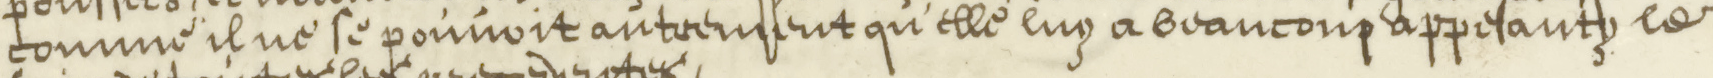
comme il ne se pouuoit autrement qu‛elle luy a beaucoup appesanty le
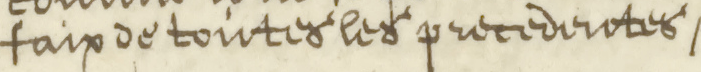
faix de toutes les precedentes
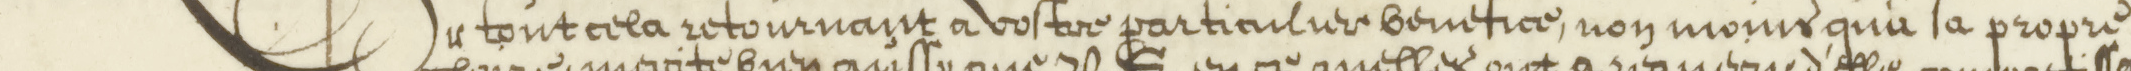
Ou tout cela retournant a vostre particulier benefice, non moins qua sa propre
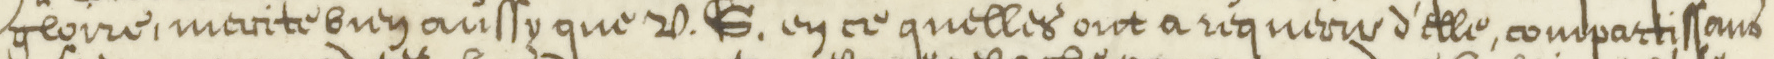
gloire, merite bien aussy que V.S. en ce quelles ont a requerir d‛elle, compartissans
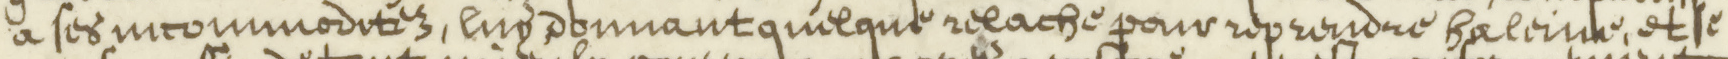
a ses incommoditez, luy donnant quelque relache pour reprendre haleine, et se
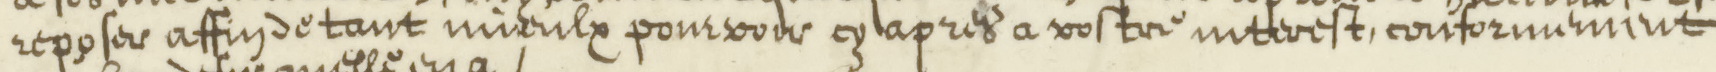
reposer affin de tant mieulx pourvoir cy apres a vostre interest, conformement
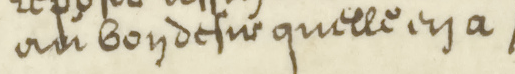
au bon desir quelle en a.
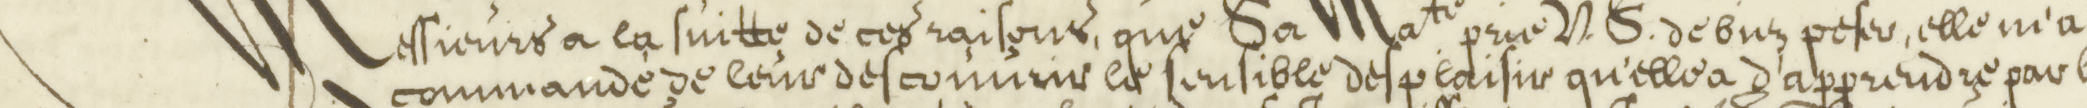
Messiers a la suitte de ces raisons que Sa Mate. prie V.S. de bien peser, elle m‛a
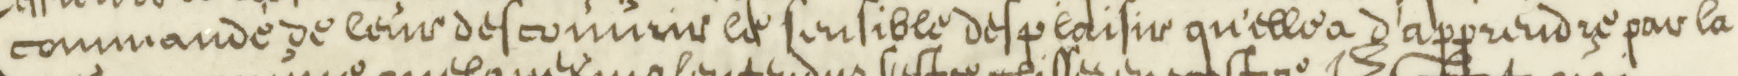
commande de leur descouurir le sensible desplaisir qu'elle a d‛apprendre par la
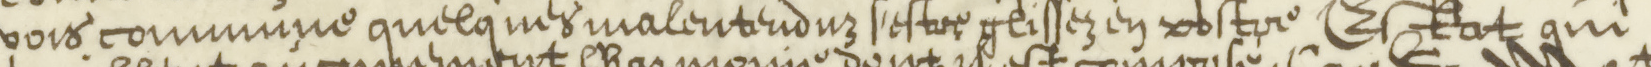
voix commune quelques malentenduz s‛estre glissez en vostre Estat qui
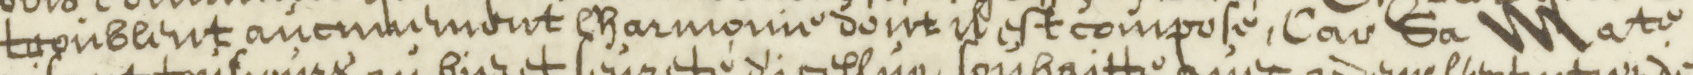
troublent aucunement l‛harmonie dont il est compose, Car Sa Mate.
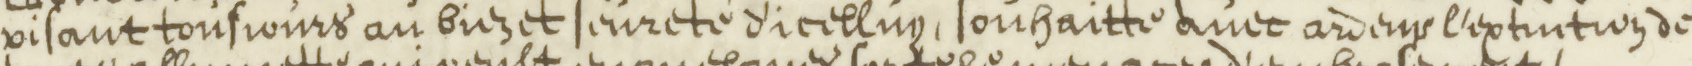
visant tousiours au bien et seureté d‛icelluy, souhaitte auec ardeur l‛extintien de
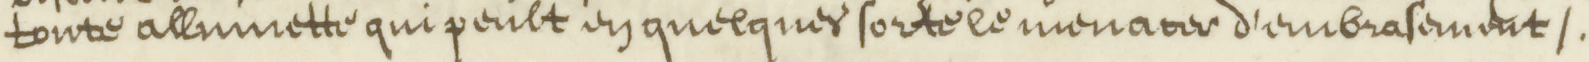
toute allumette qui peult en quelques sorte le menacer d'embrasement.
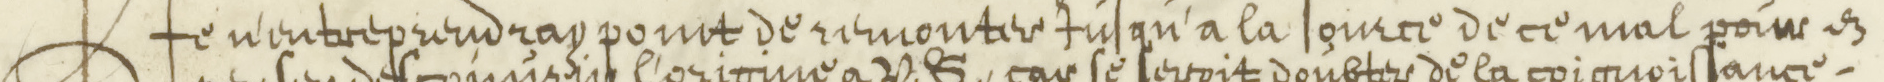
Je n‛entreprendray point de remonter Jusqu‛a la source de ce mal pour en
